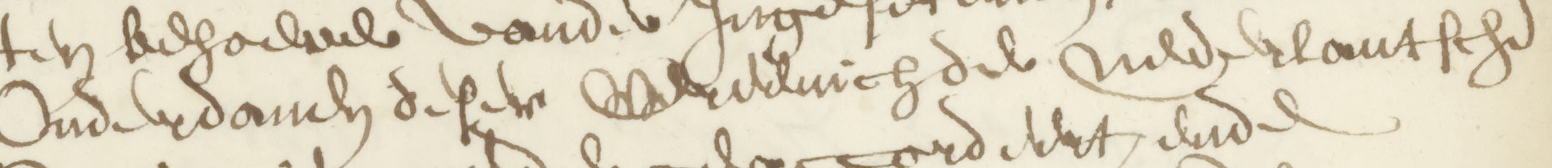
Onderdanen deser Vereenichde Nederlantsche
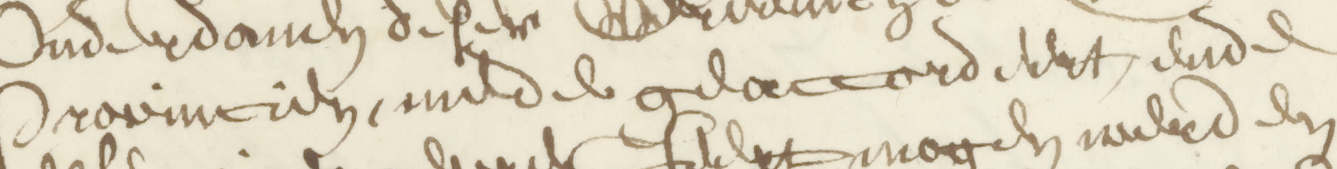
Provincien, mede geaccordeert, ende
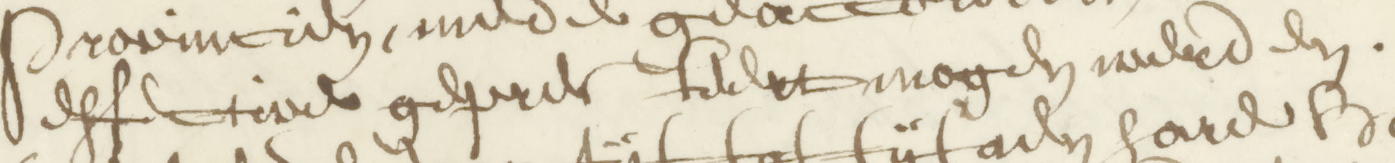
effective gepresteert mogen werden.
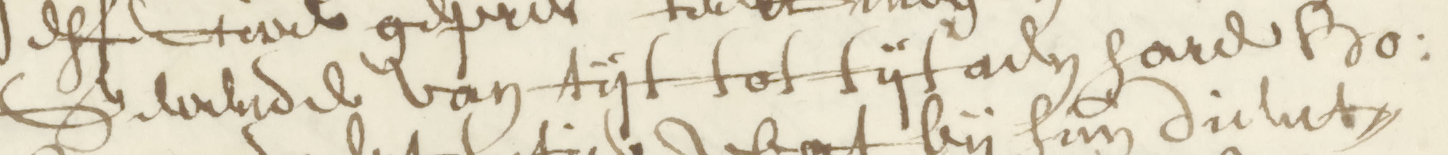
Gevende van tijt tot tijt aen hare Ho:
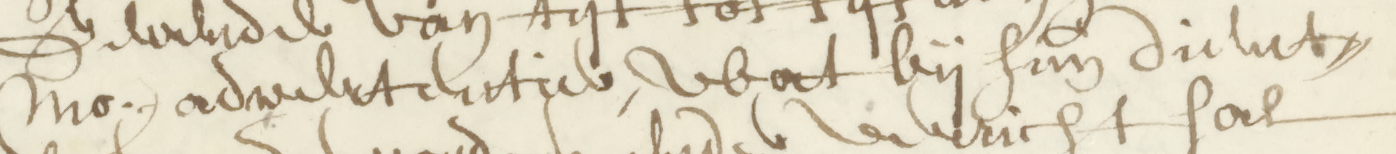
Mo: advertentie, wat en hun dient„
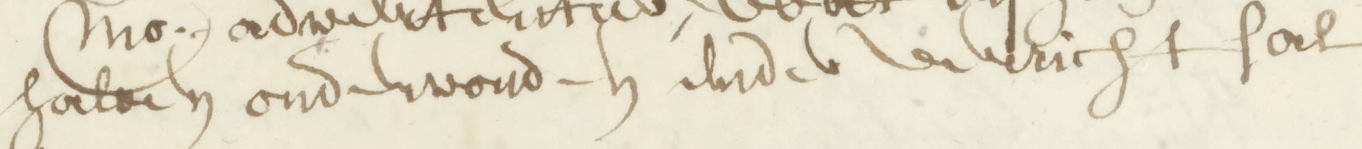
halven ondervonden ende verricht sal
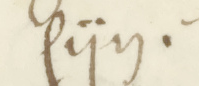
sijn.
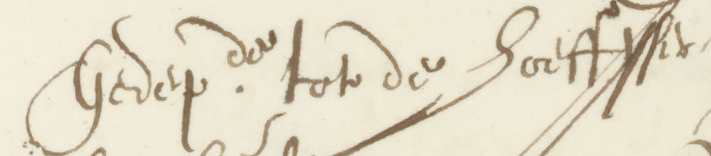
Gedepde tot de Hoeffysser
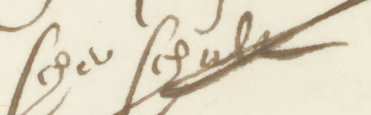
sche schult
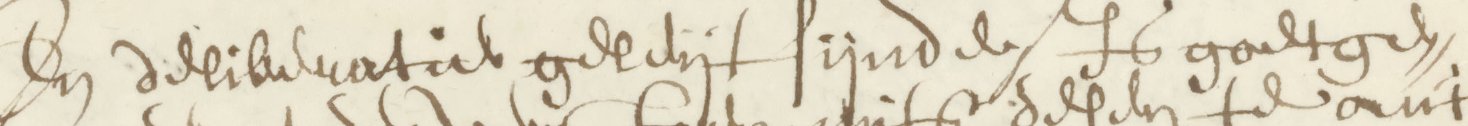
in deliberatie geleijt sijnde, Is goetge„,
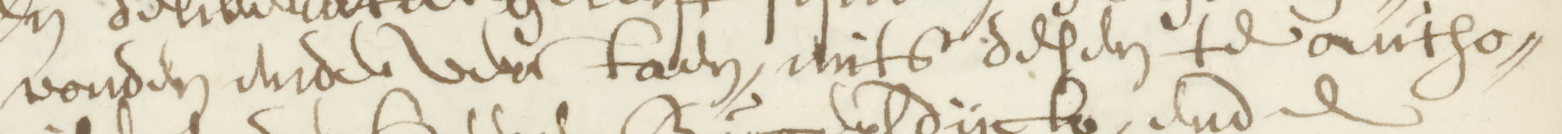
vonden ende verstaen, mits desen te autho,,
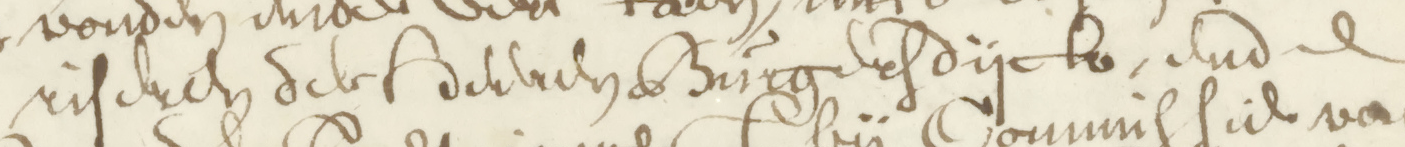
riseren de Heeren Burgersdijck, ende
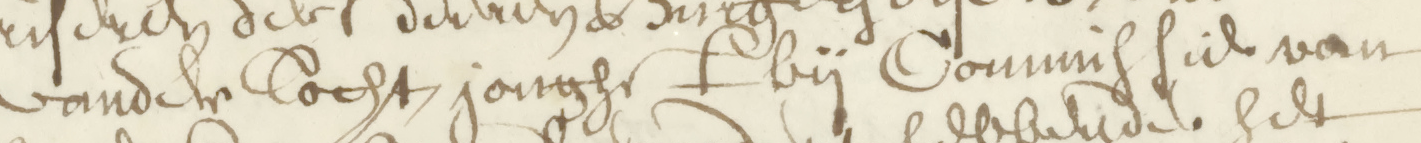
vander Tocht, jonghst bij Commissie van
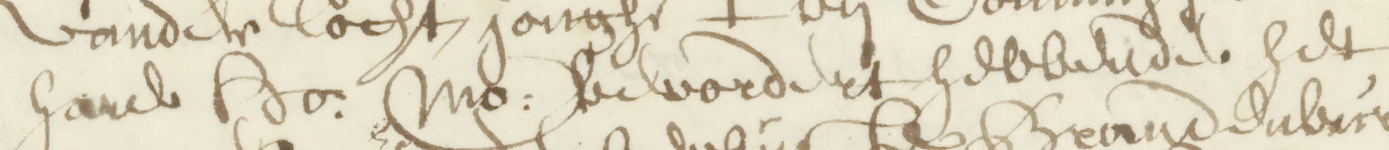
hare Ho:Mo: bevordert hebbende het
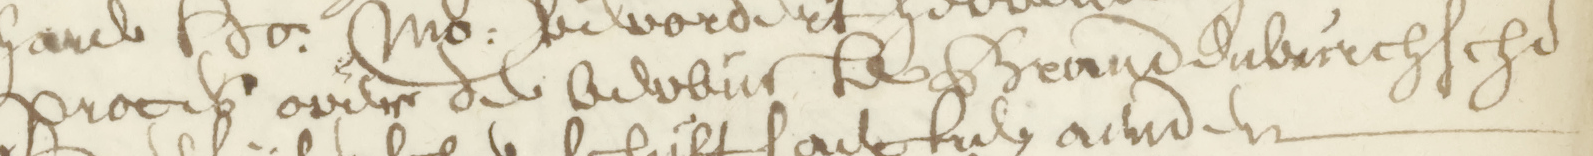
proces over de bewuste Brandenburchsche
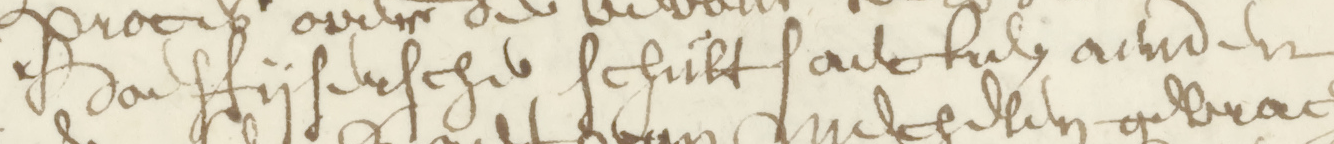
Hoeffijsersche schultsaecken aenden
